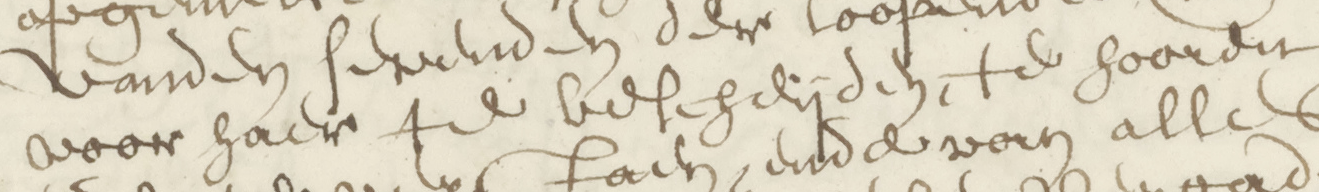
voor haer te bescheijden, te hooren
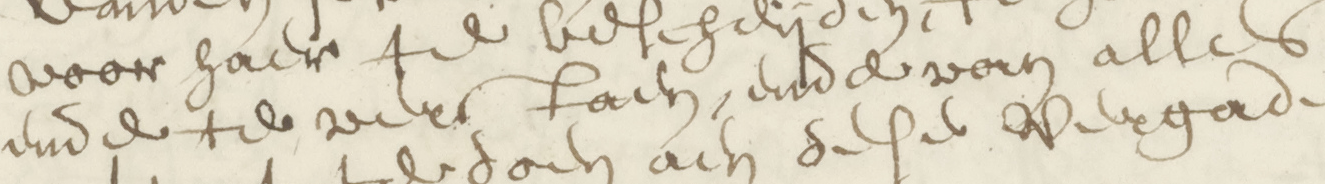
ende te verstaen, ende van alles
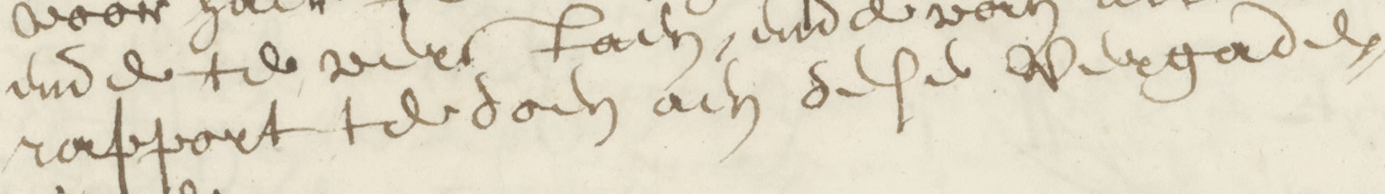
rapport te doen aen dese Vergade„
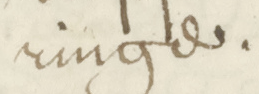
ringe.
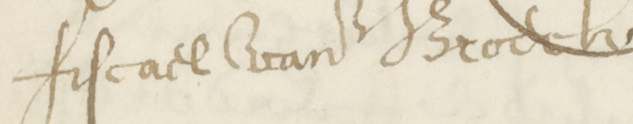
Fiscael van Broeck
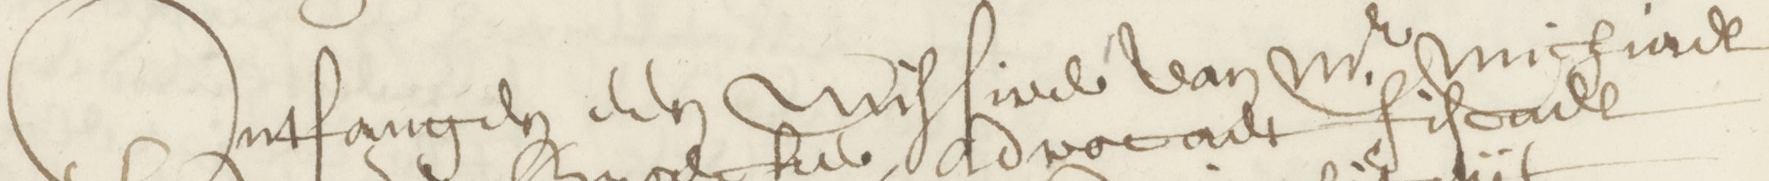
Ontfangen een Missive van Mr. Michiael
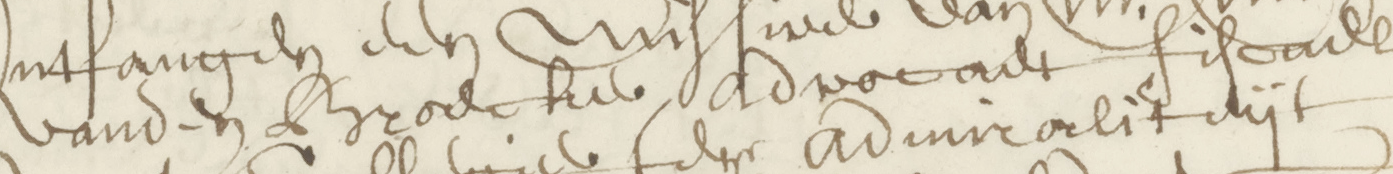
vanden Broecke, Advocaet fiscael
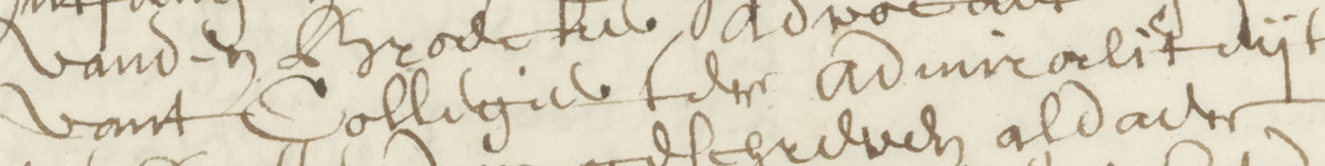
vant Collegie ter Admiraliteijt
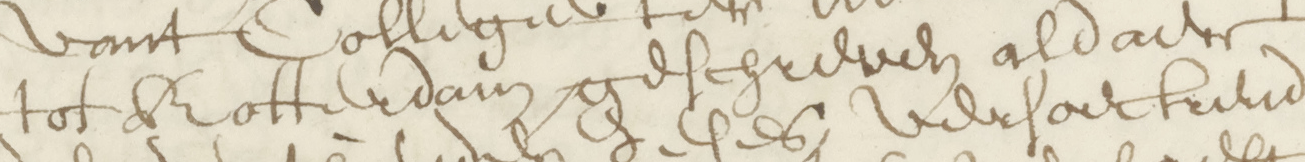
tot Rotterdam, geschreven aldaer
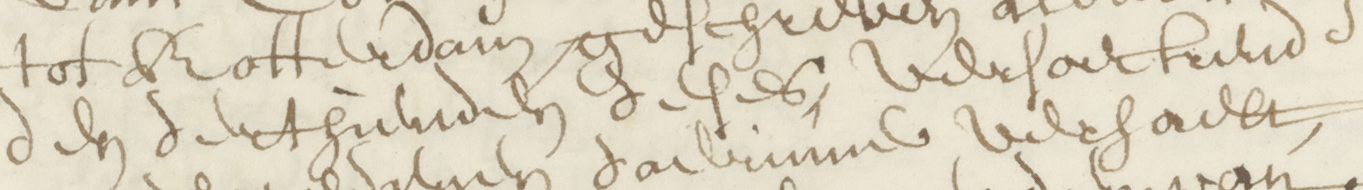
den derthienden deses, versoeckende
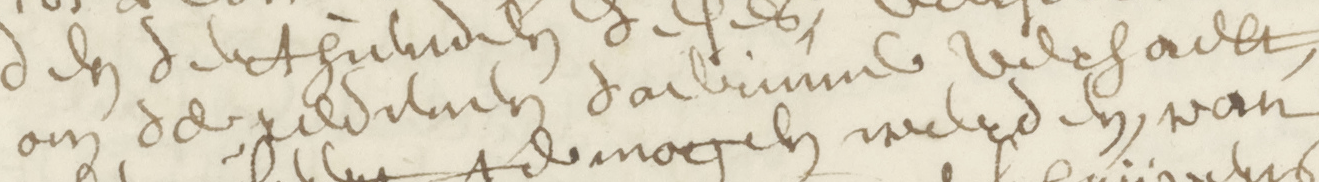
om de redenen daerinne verhaelt,
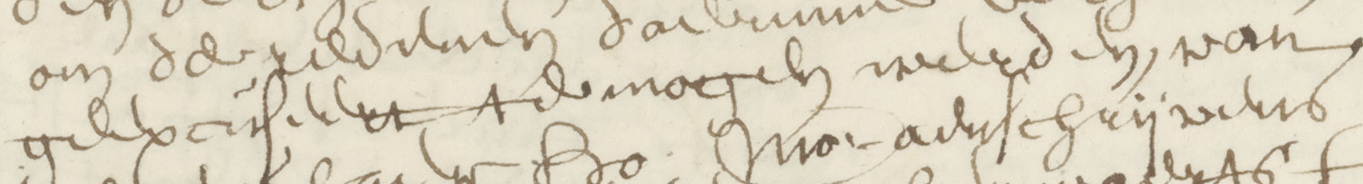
geexcuseert te mogen werden, van
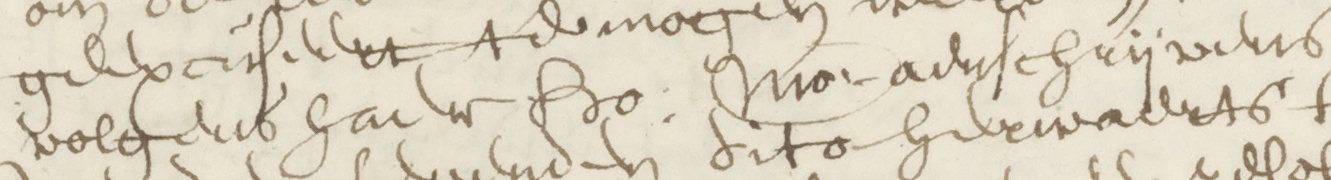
volgens haer Ho:Mo: aenschrijvens
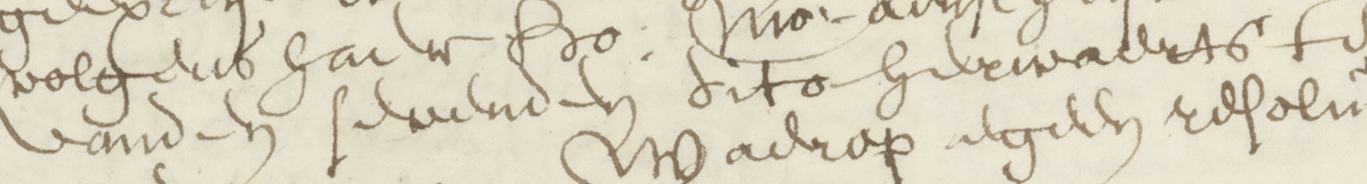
vanden sevenden dito herwaerts te
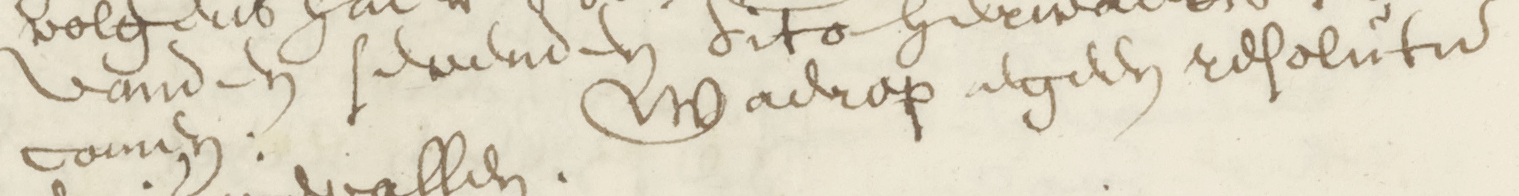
comen: Waerop egeen resolutie
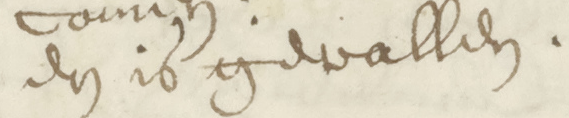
en is gevallen.
